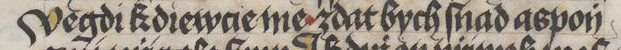Vegdi kdiewcie me.zdat bych ſnad aspoṅ
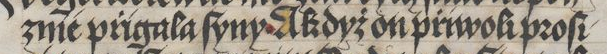zníe pṙigala ſyny.Akdyż on pṙiwoli proſi¬
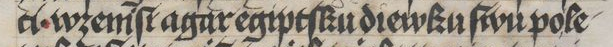cí.wzemẛi agar egiptſku diewku ſwu pole¬
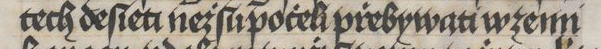tech deſieti neż ſu poċeli pṙebywati wzemi
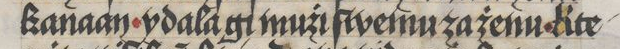kanaan.ydala gi mużi ſwemu za żenu.Kte¬
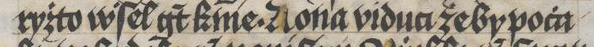ryżto wẛel ḡt kníe.A ona viduci żeby poċa¬
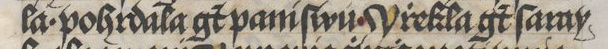la.pohrdala ḡt paní ſwu.Yṙekla ḡt ſaray
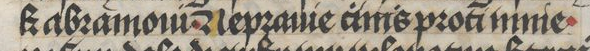k abramovi.Neprauie ċiniṡ proti mnie.
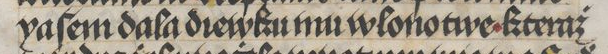yaſem dala diewku mu wlono twe.kteraž
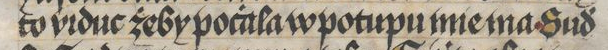to viduc żeby poċala wpotupu mie ma.Suḋ
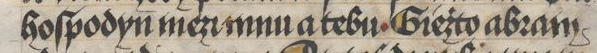hoſpodyn mezi mnu a tebu.Gíeżto abram
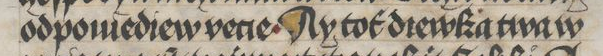odpouiediew vecie. Ay toť diewka twa w
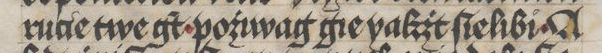rucie twe ḡt.pożiwag gíe yakžt ſie libi.A
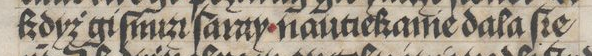kdyż gi ſnuzi ſaray.nautiekanie dala ſie
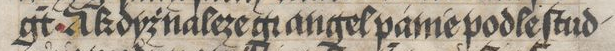ḡt Akdyż naleze gi angel panie podle ſtud¬
